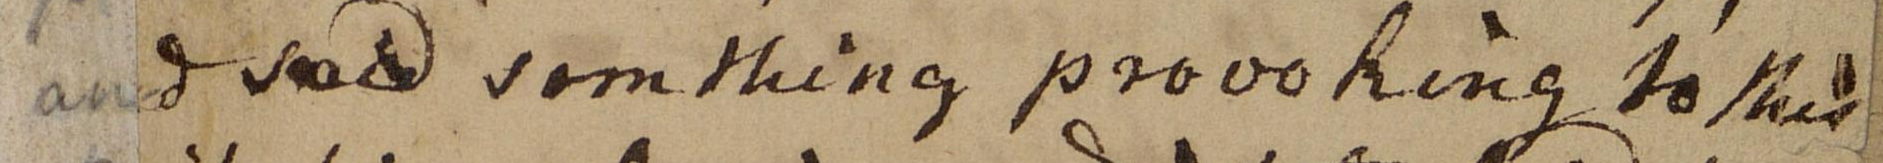and said somthing provoking to this
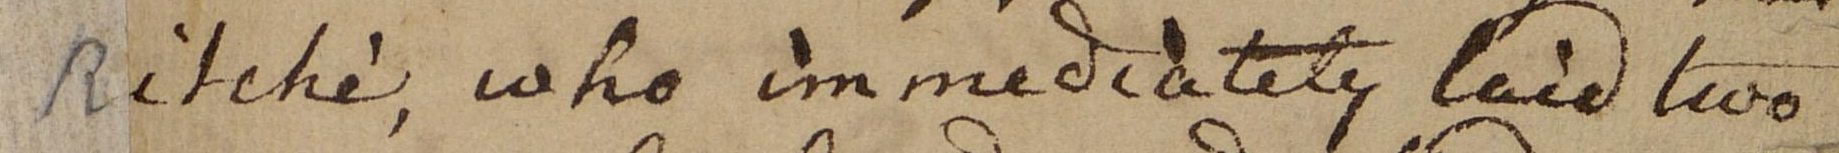Ritchi who immediately laid two
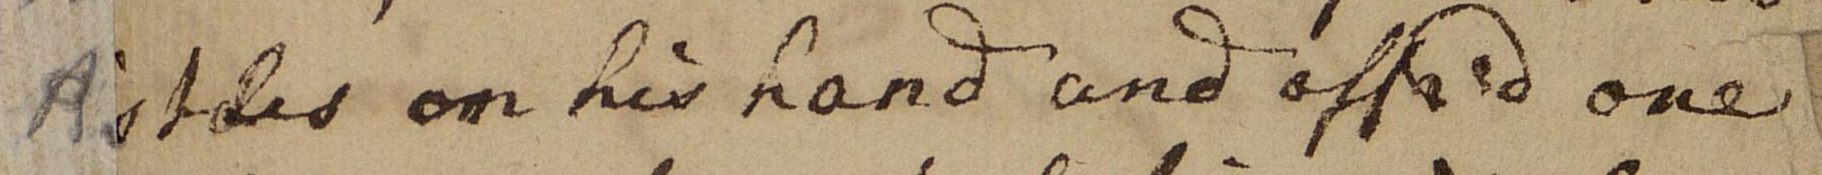[Pistles] on his hand and offr'd one
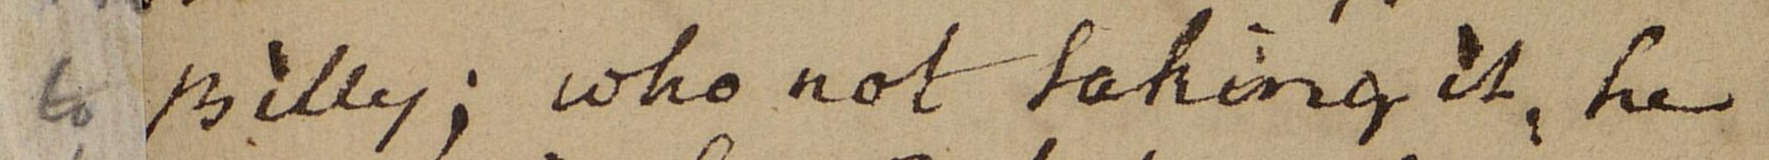to Billy; who not taking it, he
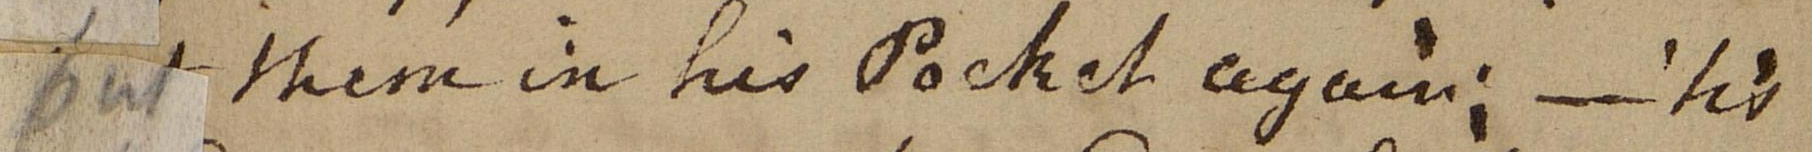but them in his Pocket again;- 'tis
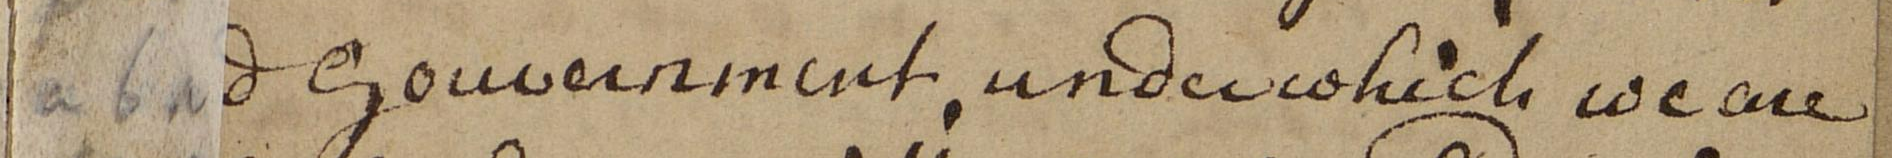a bad Gouvernment, under which we are
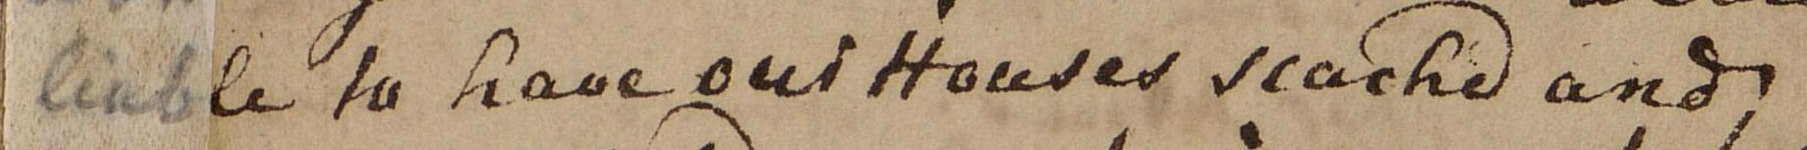liable to have our Houses seach'd and
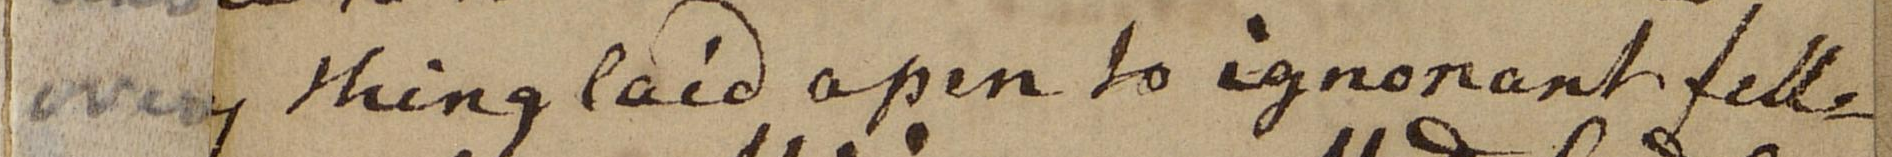every thing laid open to ignorant fell
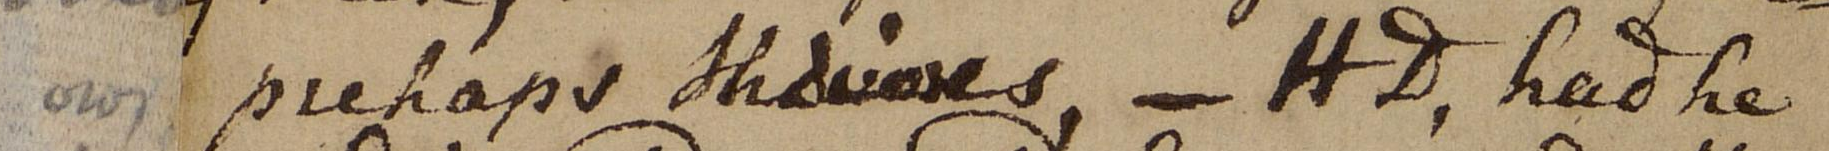ow prehaps [shivers],- HD had he
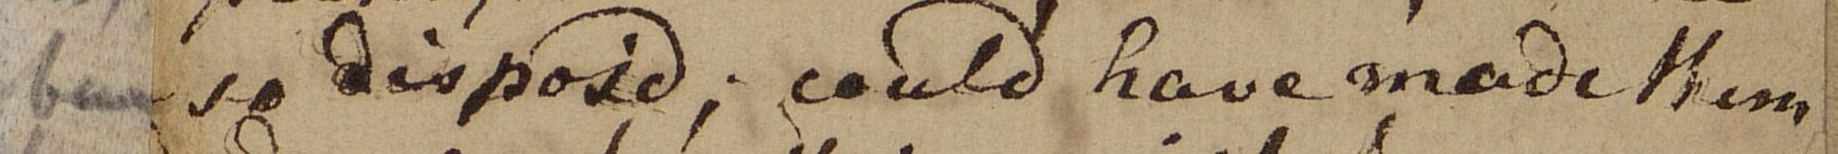[but] so dispos'd; could have made them
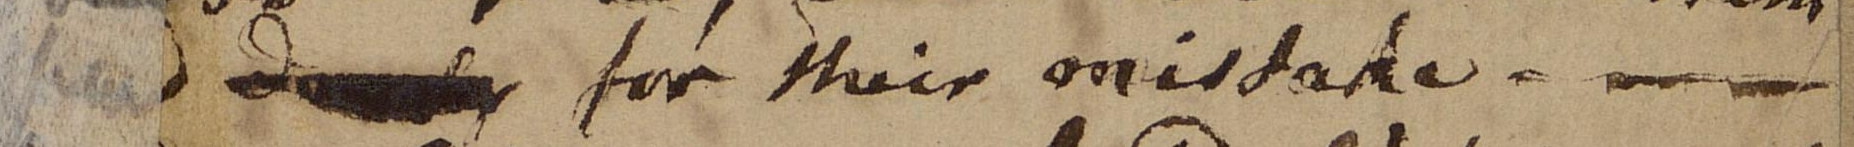[___] [deeply] for their mistake--
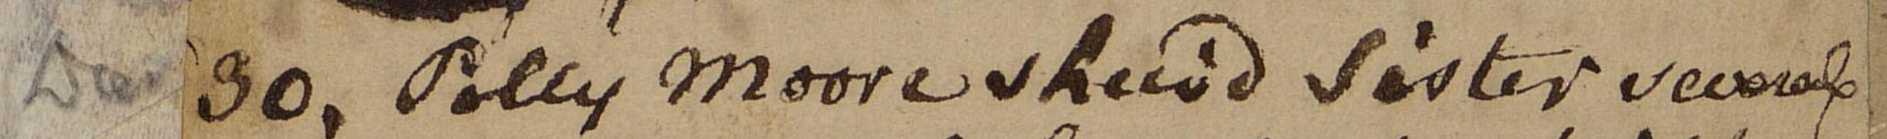Jan 30, Polly Moore shew'd Sister several
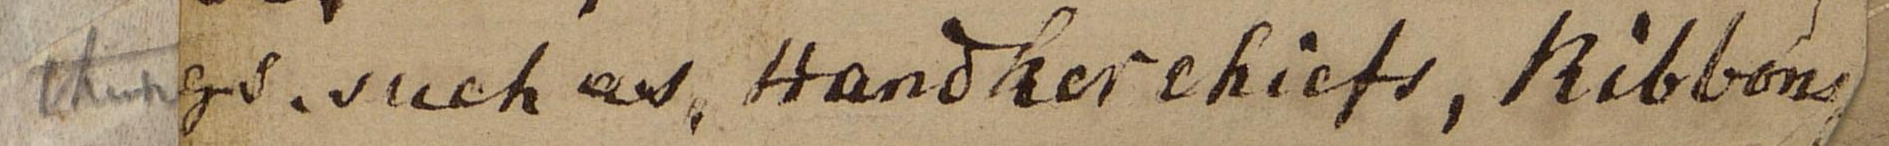things, such as, Handkerchiefs, Ribbons,
